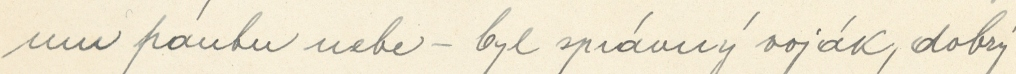mu pánbu nebe - byl správný voják, dobrý
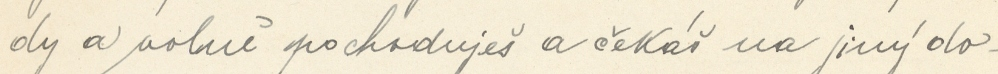dy a volně pochoduješ a čekáš na jiný do-
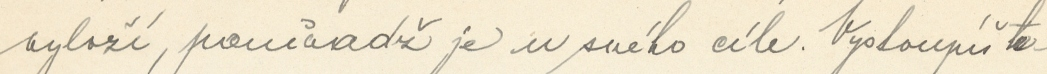vyloží, poněvadž je u svého cíle. Vystoupíš te-
